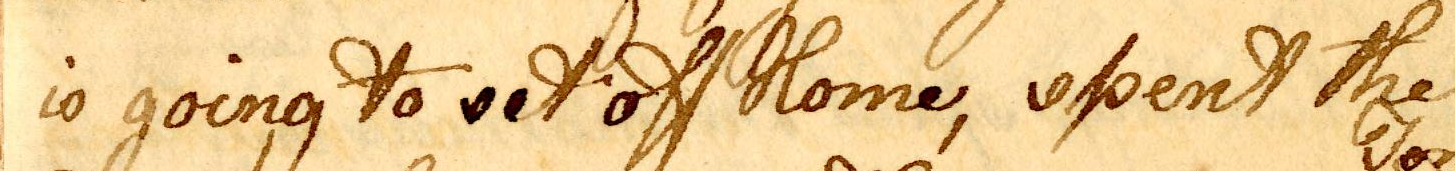is going to set off Home, spent the
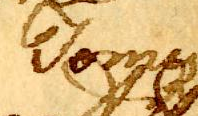Tomy
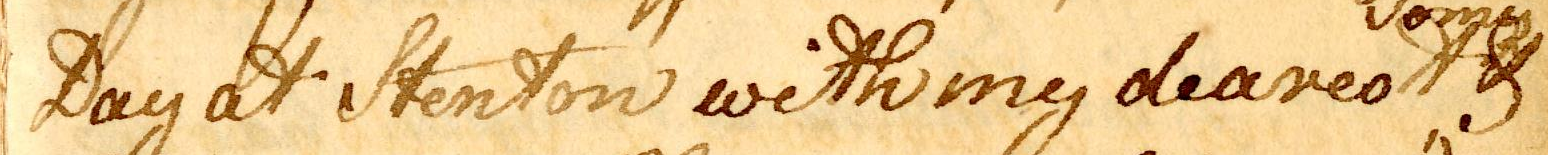Day at Stenton with my dearest ^ &
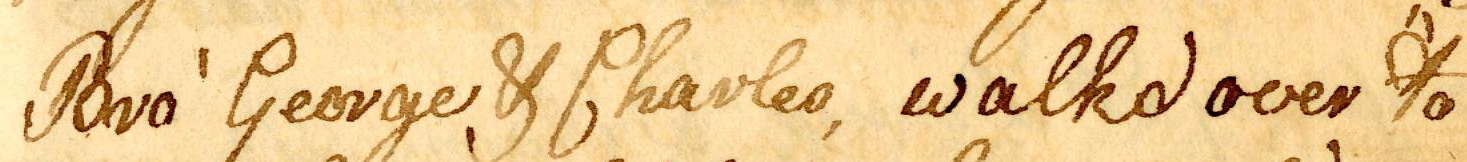Bro' George & Charles, walkd over to
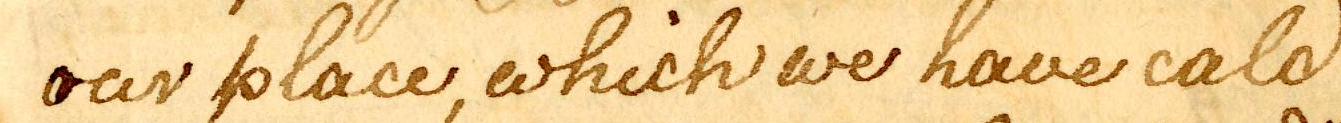our place, which we have cald
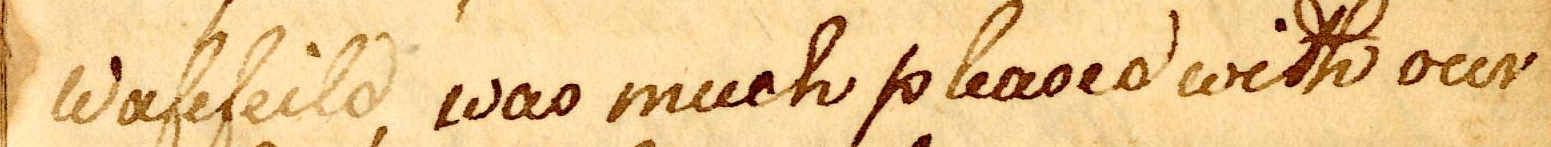Wafefeild, was much pleased with our
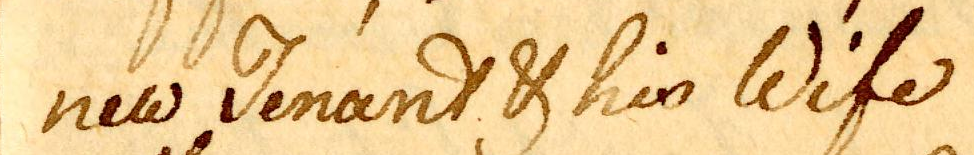new Tenant & his Wife
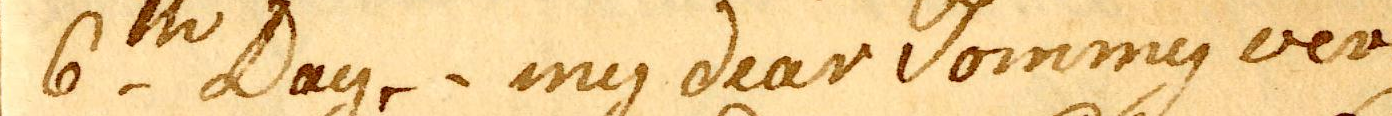6^th Day- my dear Tommy very
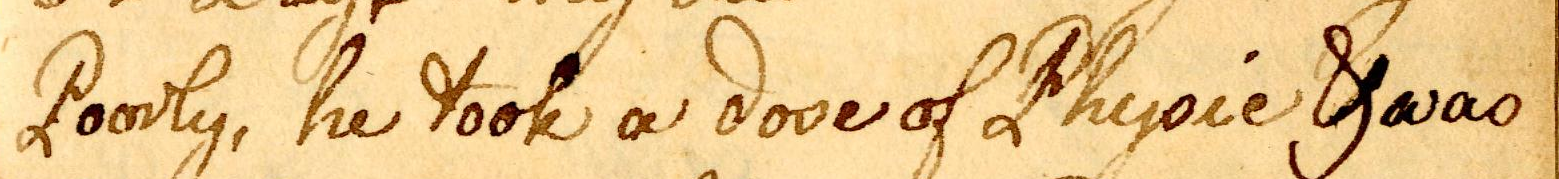Poorly, he took a dove of Physic & was
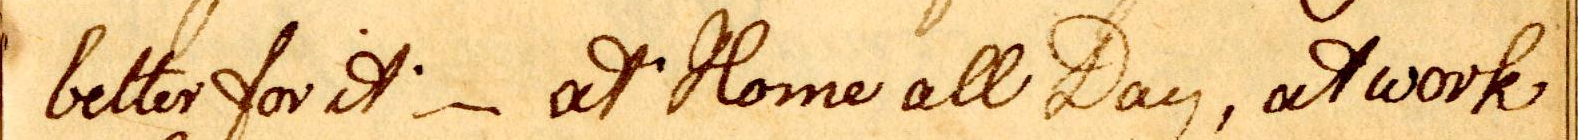better for it- at Home all Day, at work
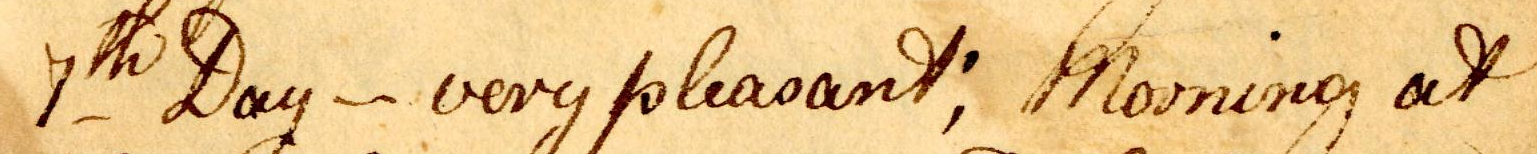7^th Day- very pleasant, Morning at
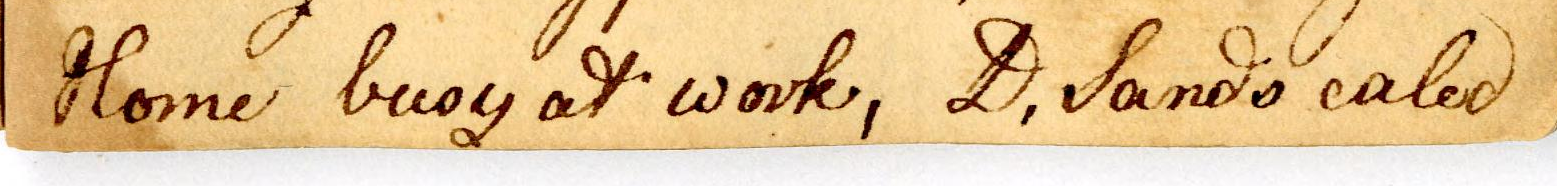Home busy at work, D. Sands caled
